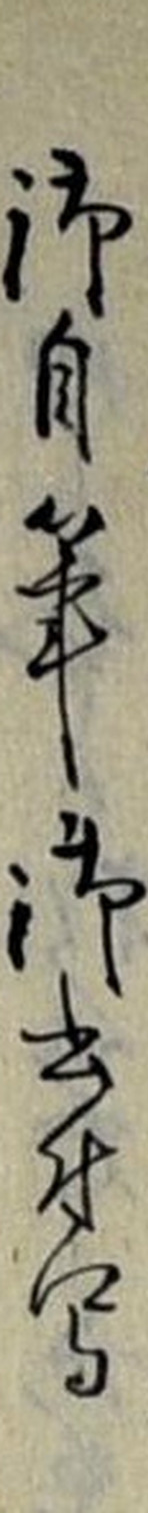御自筆御書付写
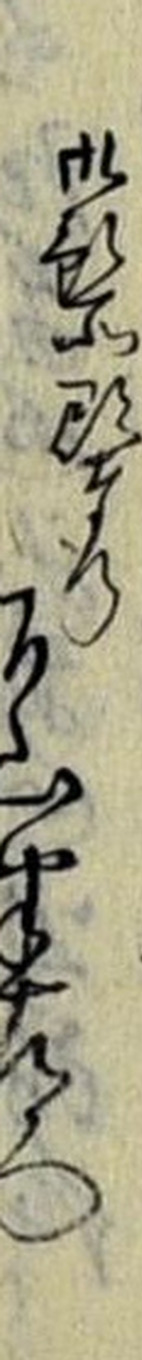御預所郡奉行下山半左衛門
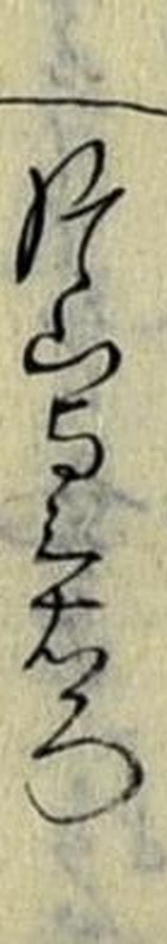片山与三右衛門
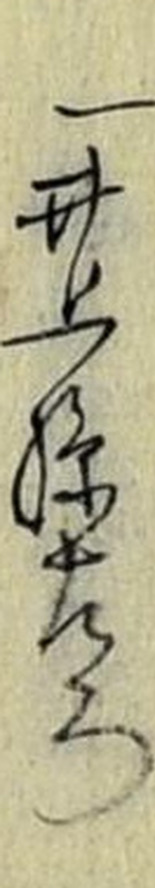井上孫左衛門
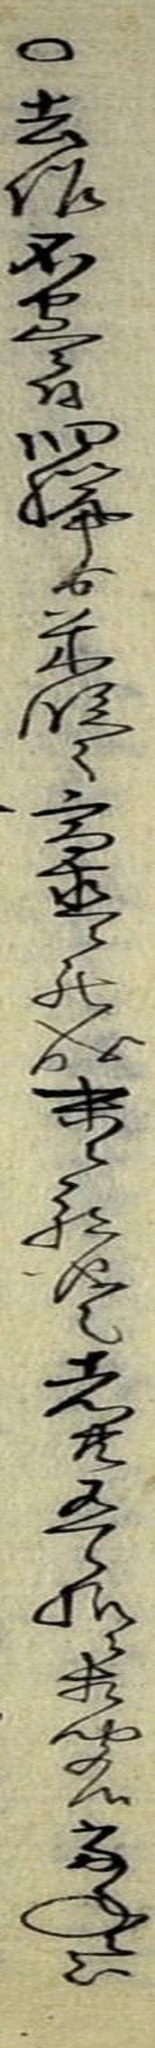〇去作不宜ニ付旧臘ゟ米段々高直ニ罷成末々難儀之者共有之様ニ相聞候当年ニ至
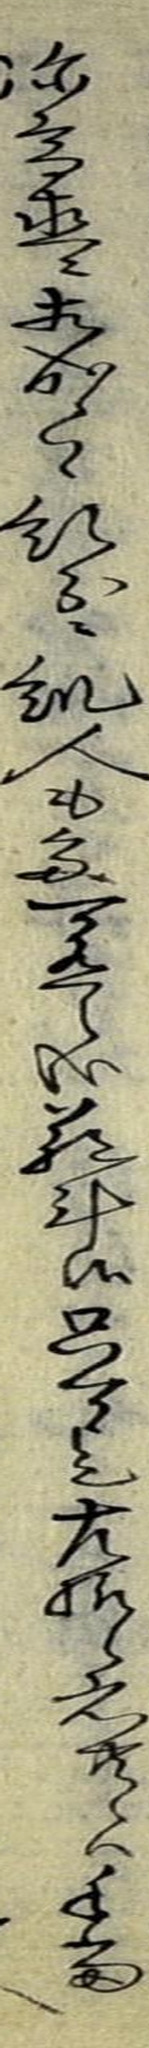弥高直ニ相成候ハヽ領分ニ飢人も多可有之哉難計候只今迄左様之者共へハ手当
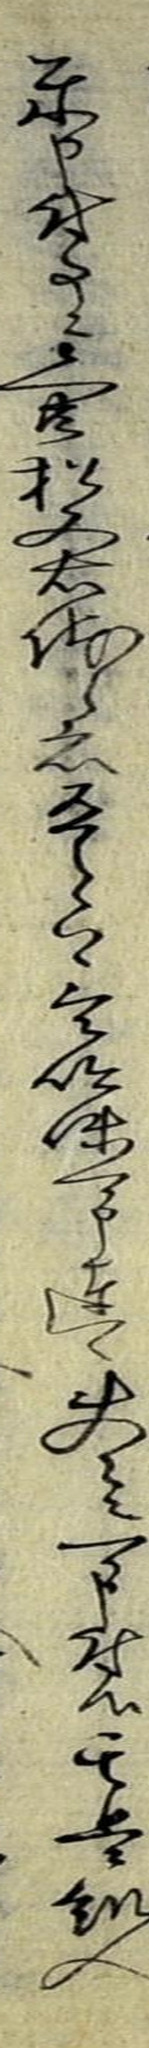米申付事ニ候へ共猶又右体之者有之候ハヽ令吟味可申達候夫々ニ可申付候其上ニ飢人
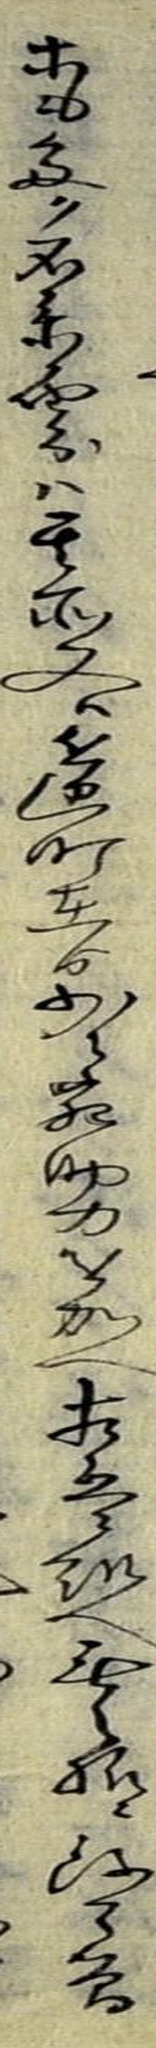等も多ク不参届分ハ其所又ハ近辺町在ゟ少々宛助力を加へ相互ニ飢人無之様ニ致了簡
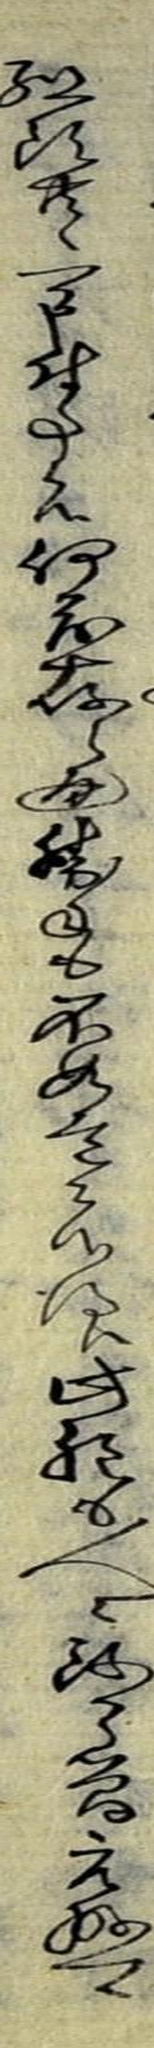組頭共へ可申付事ニ候何茂存之通勝手も不如意ニ候得ハ此程も人々致了簡取扱可
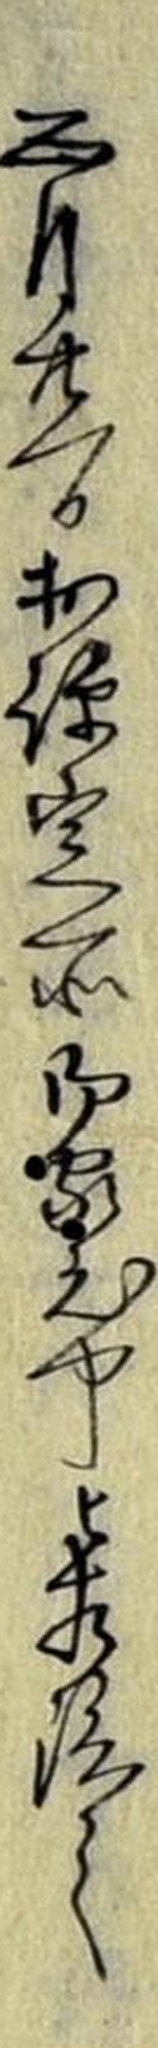正月廿一日於評定所御家老中被相渡之
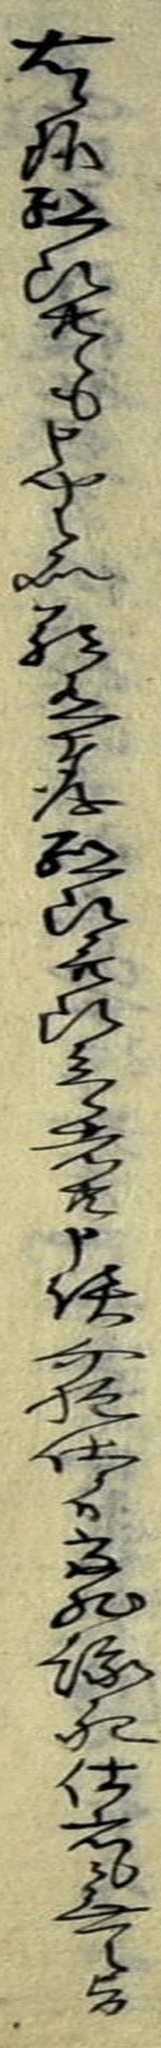右之趣組頭共へも申聞候処難有奉存組頭并頭立候者共申談介抱仕ニ付当餓死仕者も無之旨

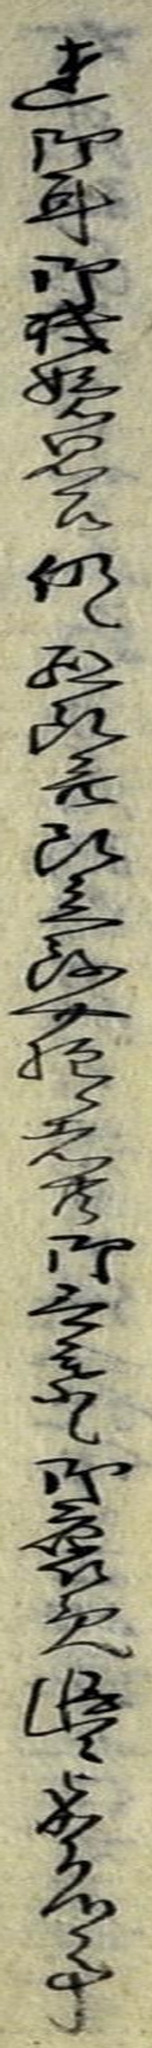達御耳御機嫌思召仍之組頭并頭立致介抱候者共御言葉之御褒美追々被成下候事
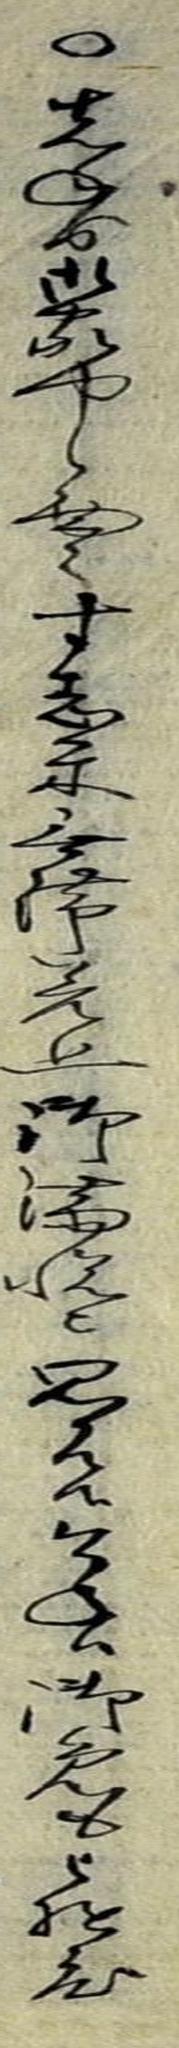〇先年ゟ御家中之面々寸志米無滞差上御満悦被思召候今年ハ御免も被遊度
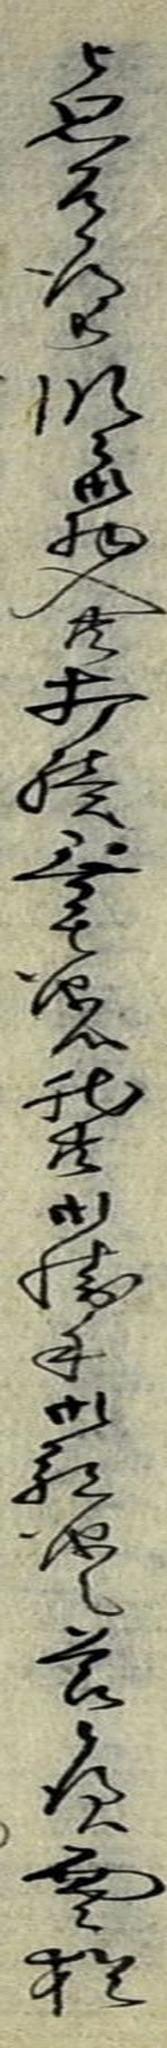被思召候得共段々御物入共打続無其儀候然共御勝手御難儀之節候得ハ面々猶
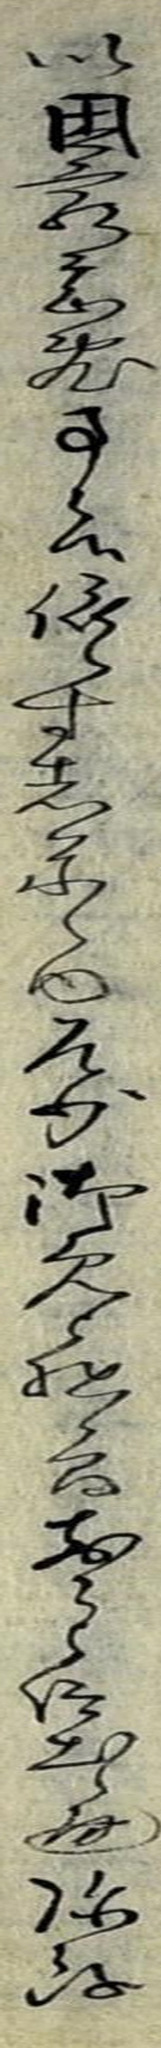以困窮甚敷事ニ候依之寸志米之内乍少御免被遊候間前々被仰出候通弥致
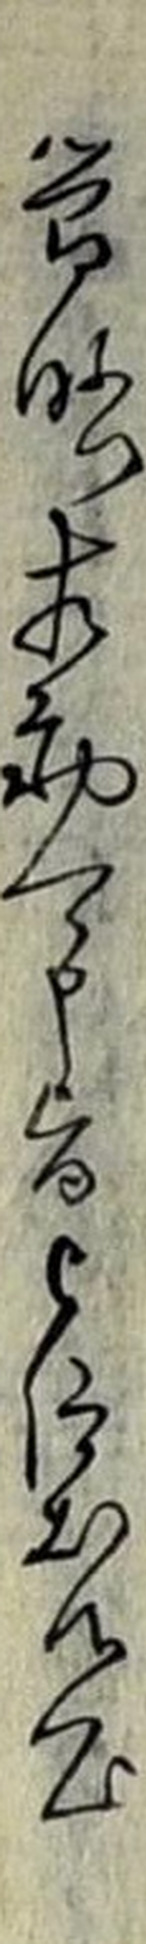簡略相勤可申旨被仰出候以上
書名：命令之部 一
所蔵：福井県文書館 Fukui Prefectural Archives
